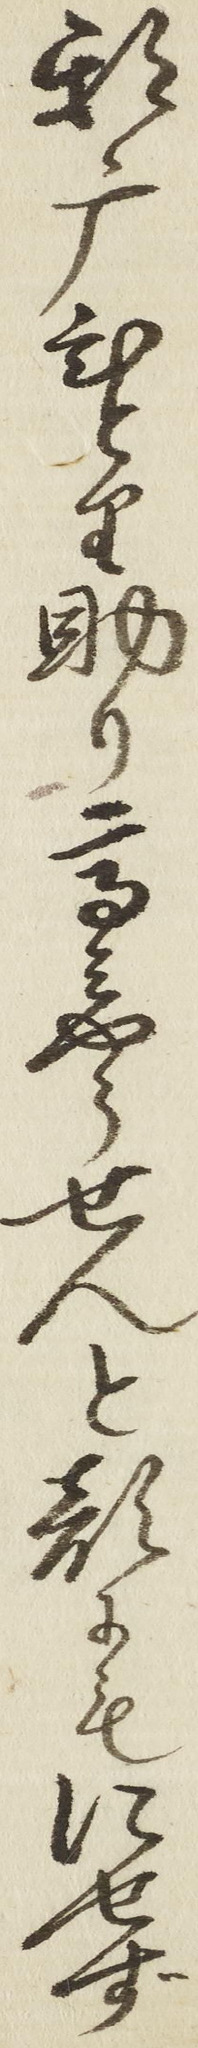邪魔ひとり助り高ミやうせんと顔にもにせず
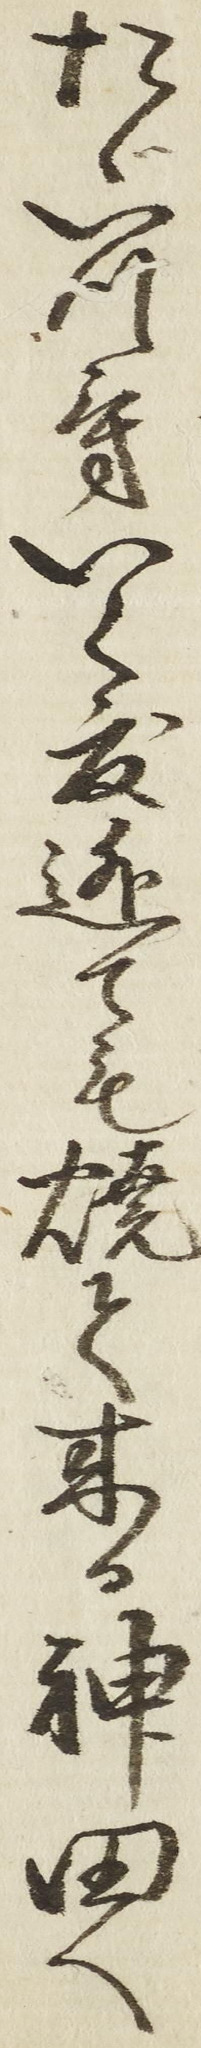たゞいつ氣いく度逃ても焼て来る神田へ
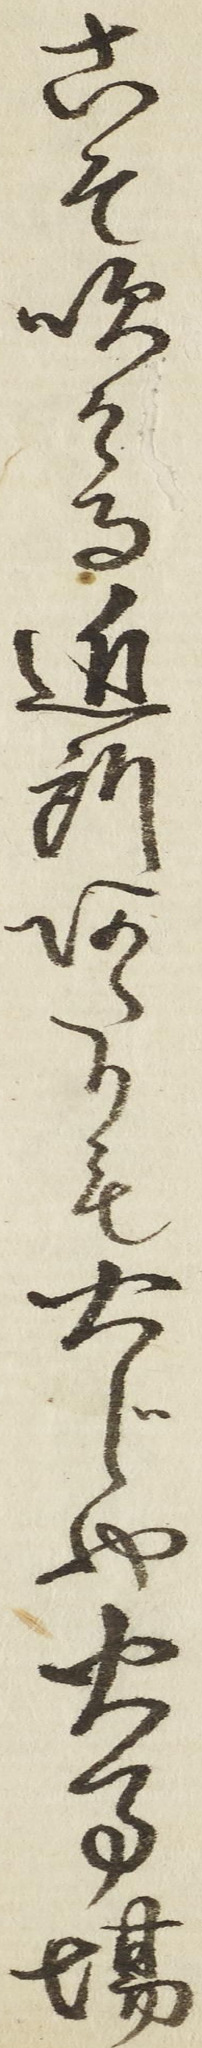こそ吹ける近所あたりも火じや火事場
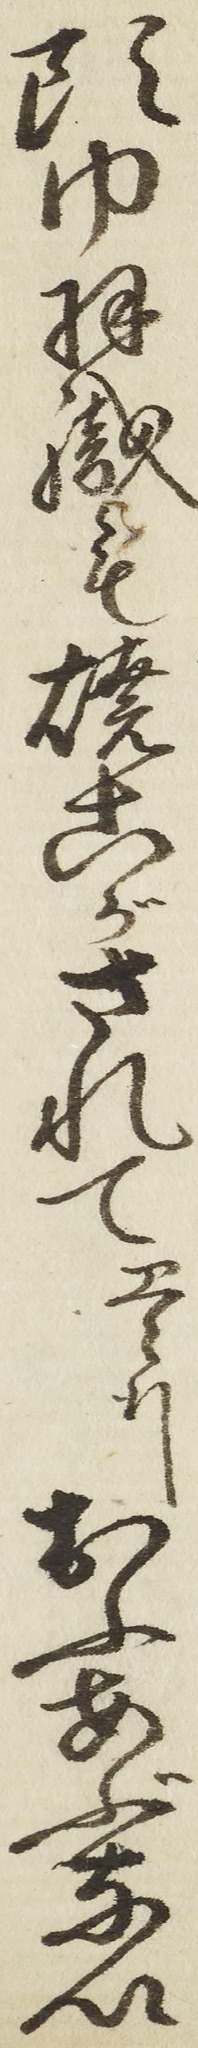頭巾羽織も焼こがされてエーいおふあぶない
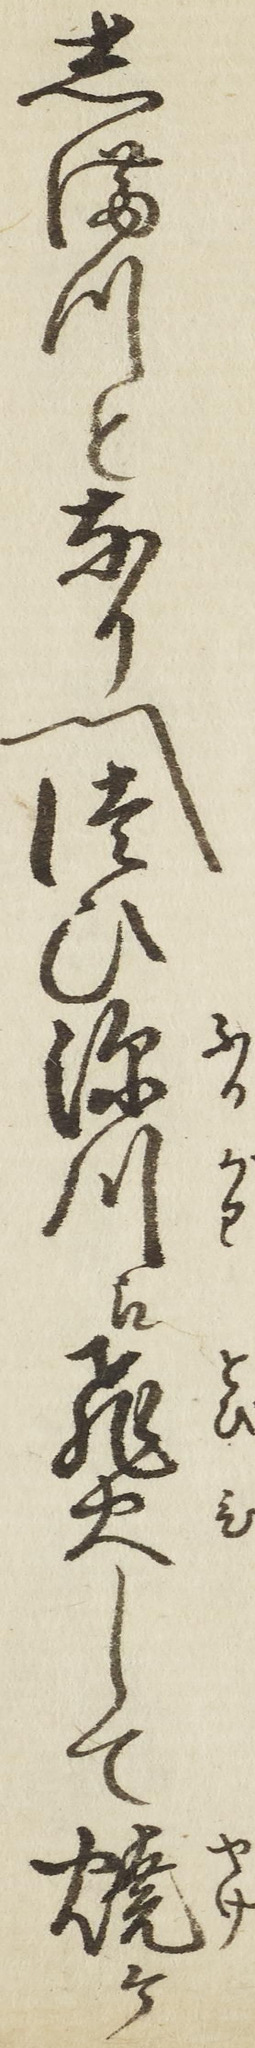しまつとなり〽つひ深川江飛火して焼ケ
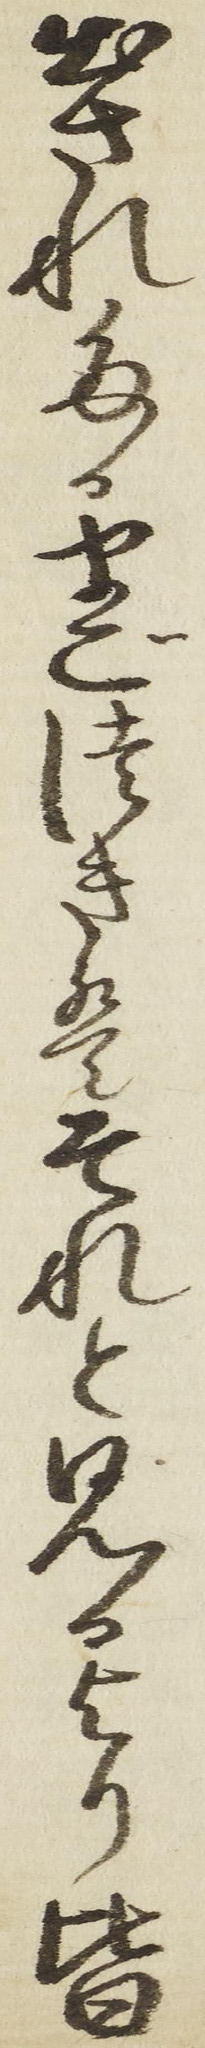出されたるまごつきはそれと見るより皆

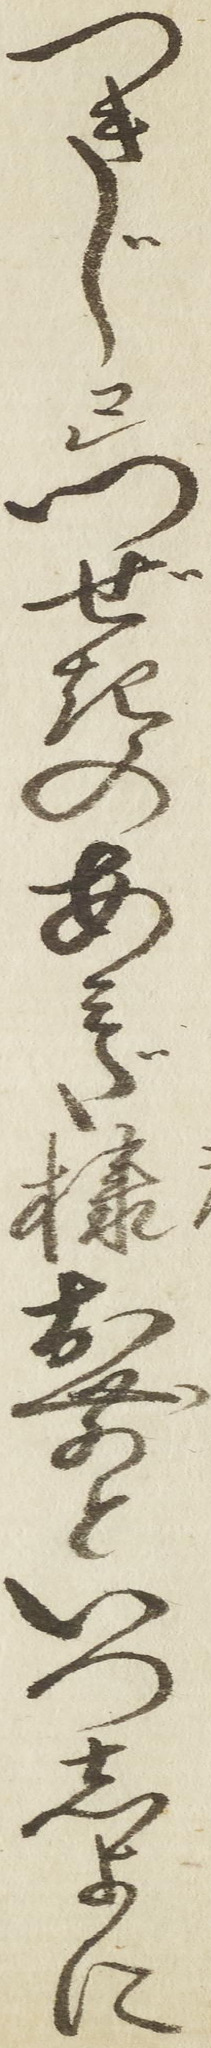つきじコレ門ぜきのあミだ様お前といつしよに
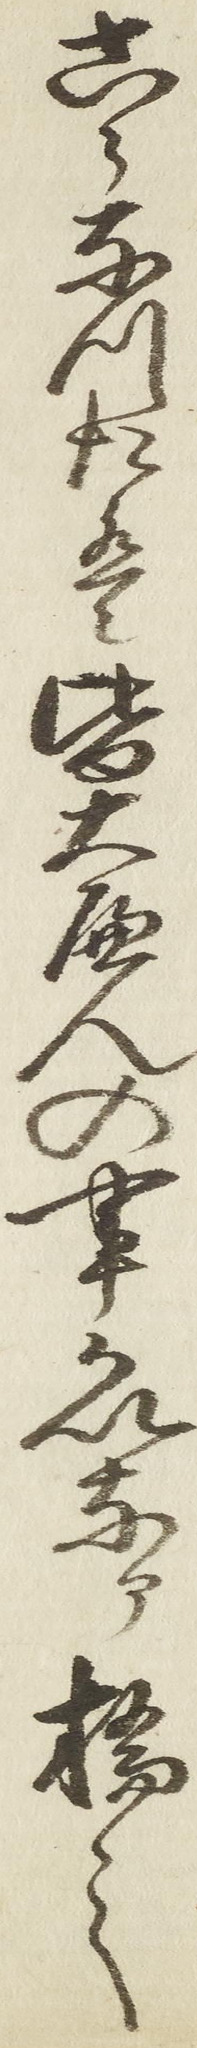こうなつたは皆大へんの事かいなア橋〴〵
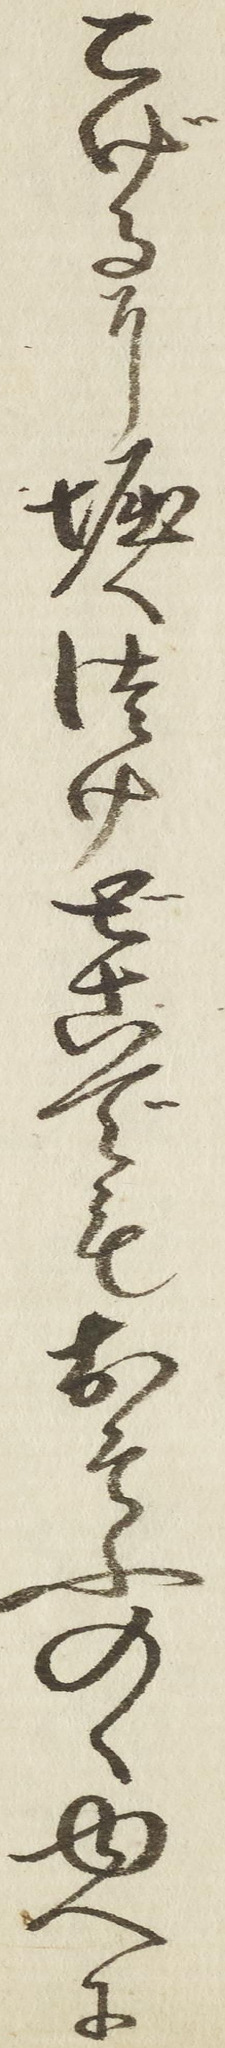こげるに堀へつけどこでもおそふのゆへに
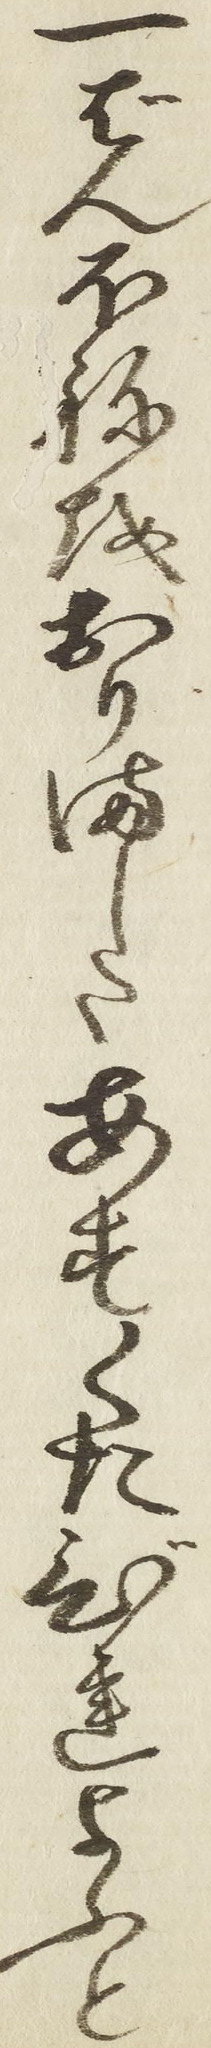一ばんふねをおりましたあすくたびれよふと
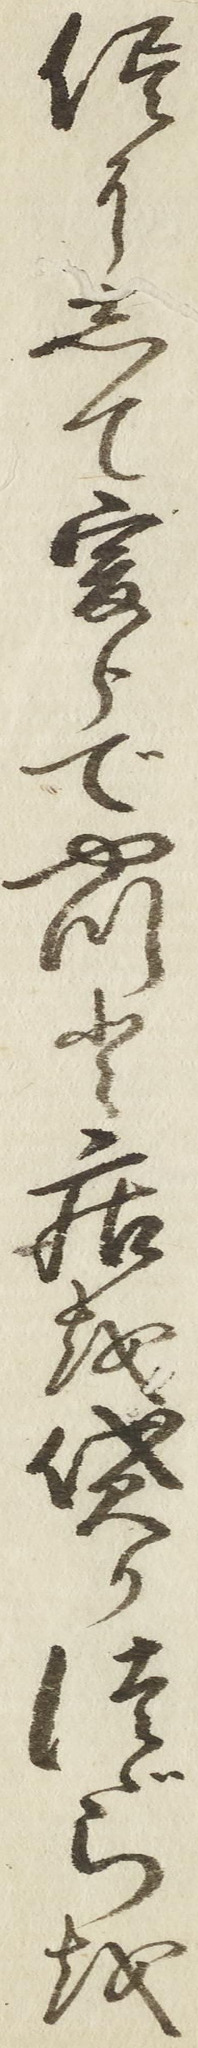儘にして爰らでやつと店を貸りつゞらを
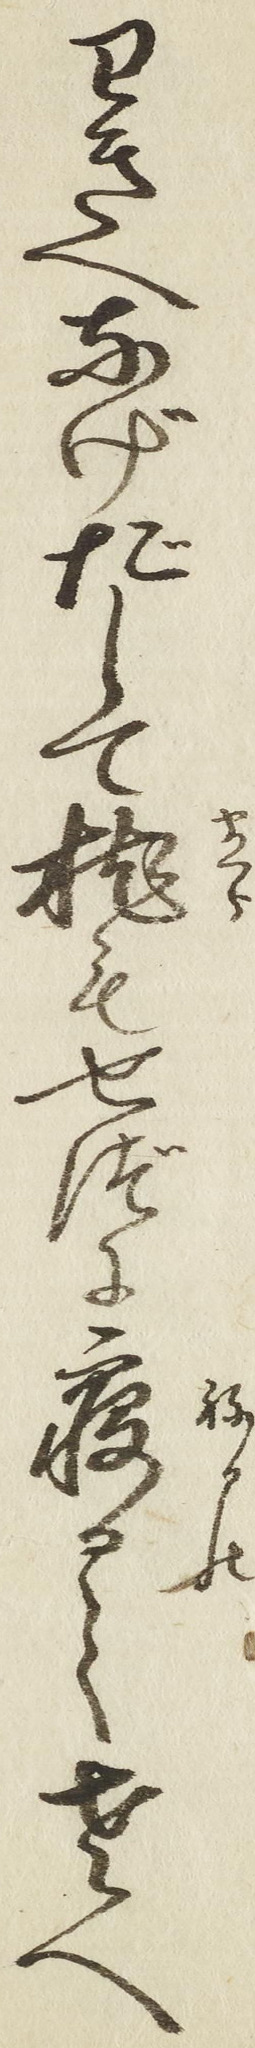わきへなげだして枕もせずに寝る之さへ
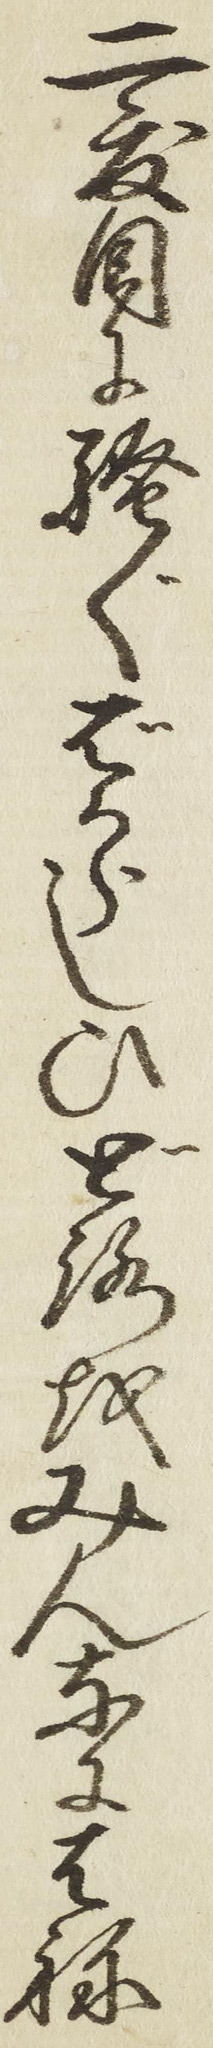二度目に騒ぐばからしひどろをみんなにはね
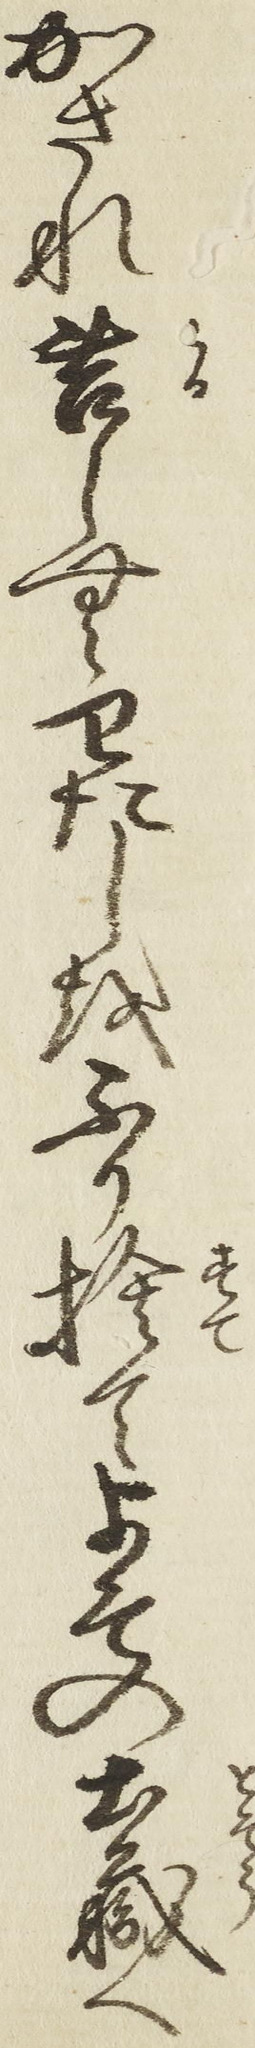かされ苦しむわたしをふり捨てよその土蔵へ
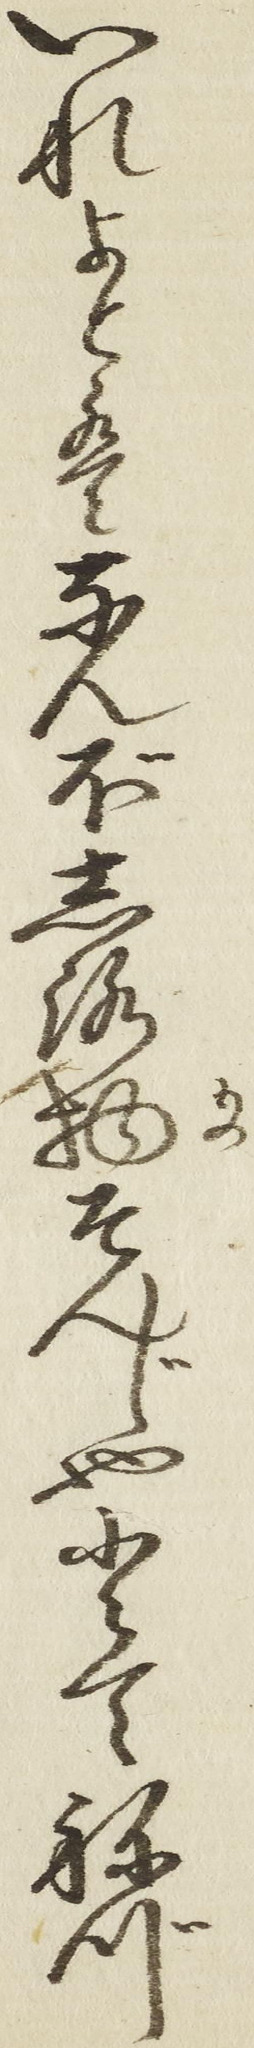いれよとはなんぼしろ物そんじやとてねず
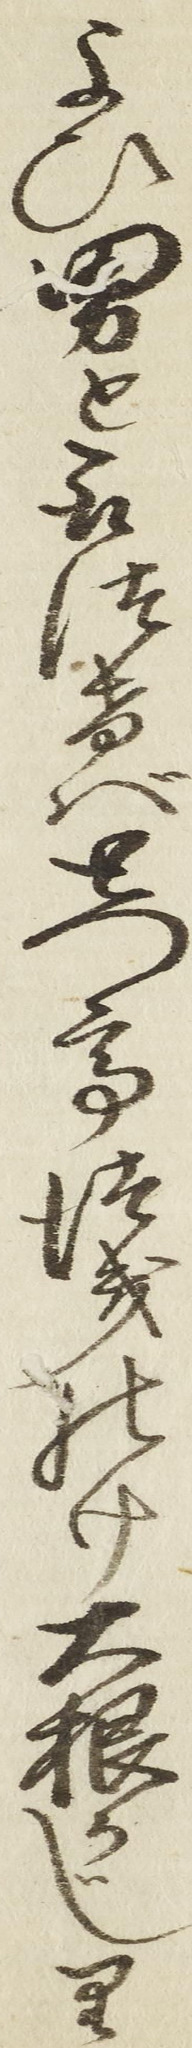よひ男と取つけバとつてつけのけ大根かじり
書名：天保佐久　滑稽茶利集記
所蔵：東京大学地震研究所図書室 Earthquake Research Institute Library, The University of Tokyo, JAPAN
